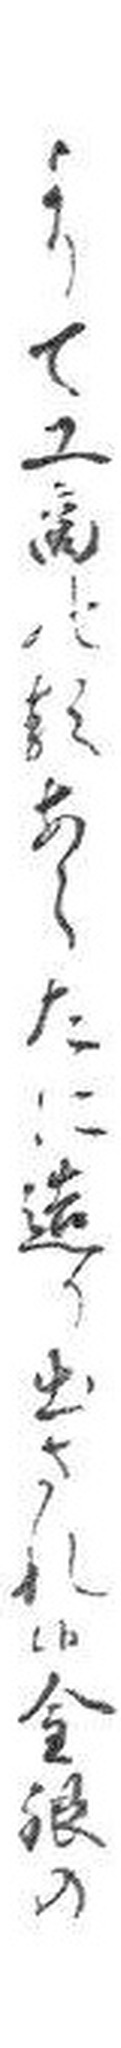よりて工商の類あらたに造り出され候金銀の
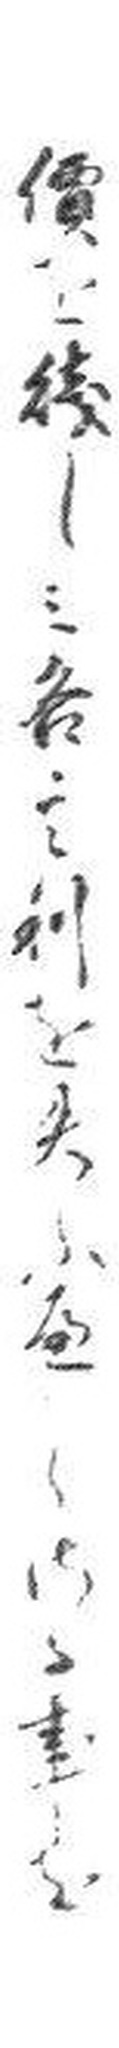價を賤しミ各其利を失ふへからさる事を
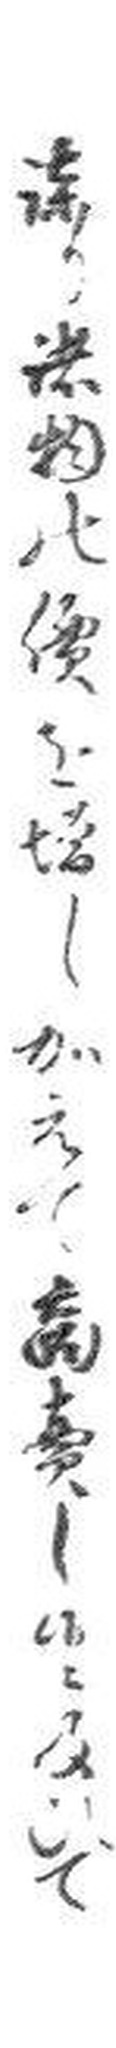謀り諸物の價を増し加えて商売し候ニ及ひて
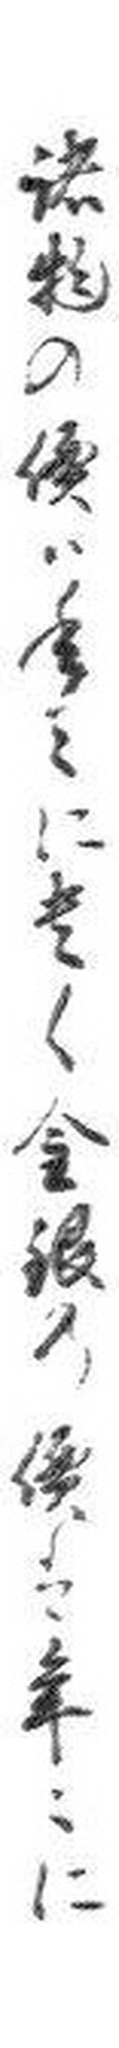諸物の價ハ年々に貴く金銀の價は年々に
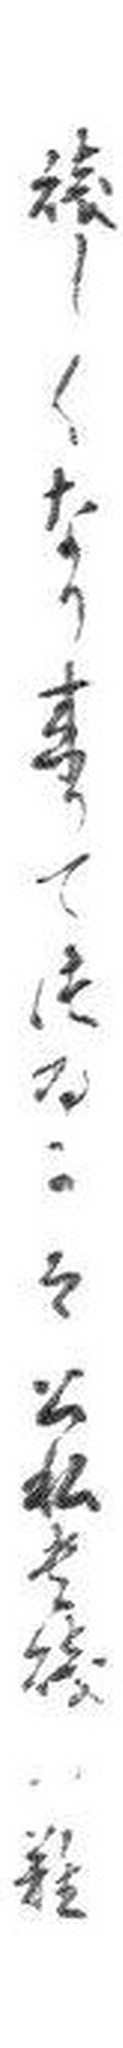賤しくなり来りてつゐには公私貴賤ハ難
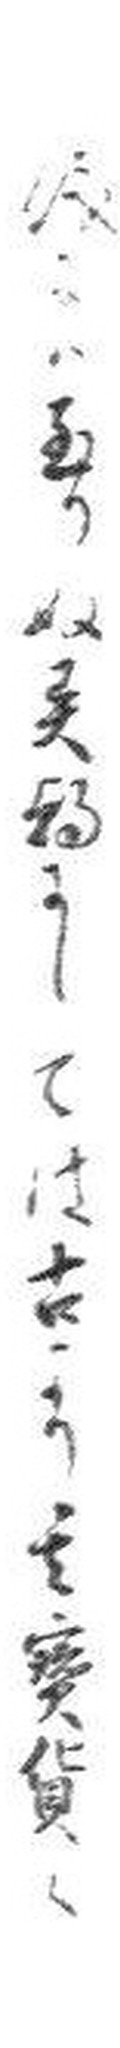儀にハ至りぬ異朝にして往古より其宝貨之
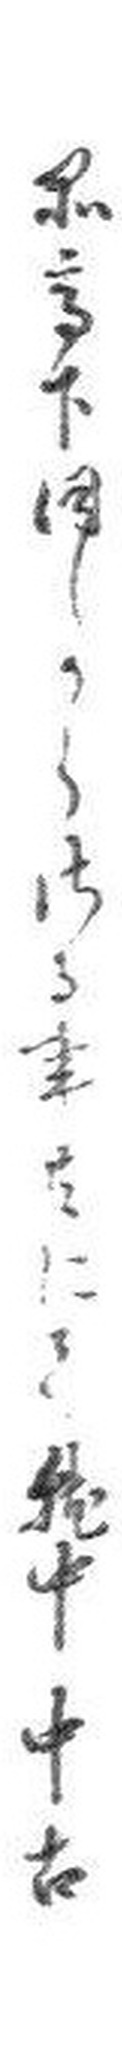品高下同しからさる事共にて就中中古
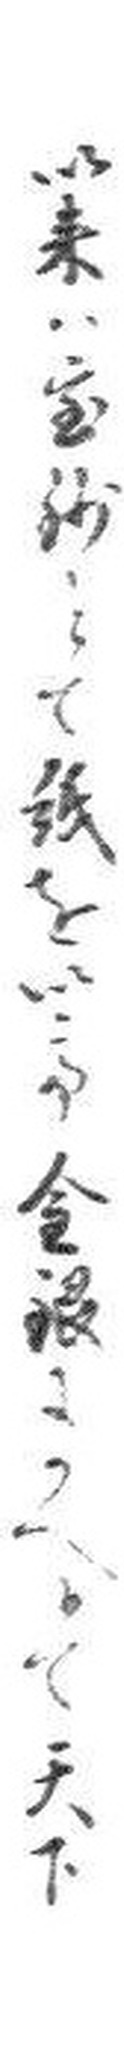以来ハ宝鈔ニて紙を以て金銀にかへ候て天下
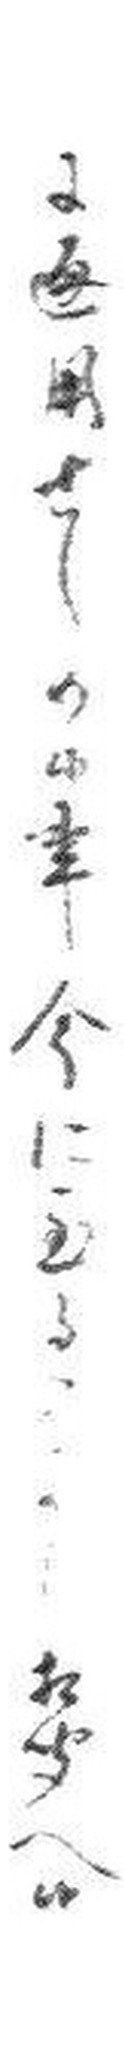に通用せしめ候事今に至るのよし相聞へ候
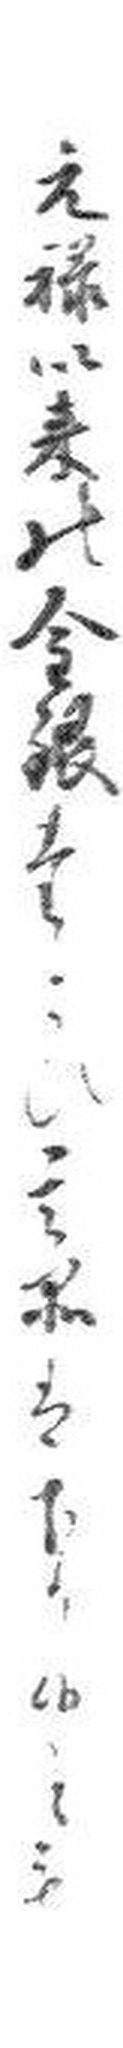元禄以来の金銀たとひ其品は下り候とも
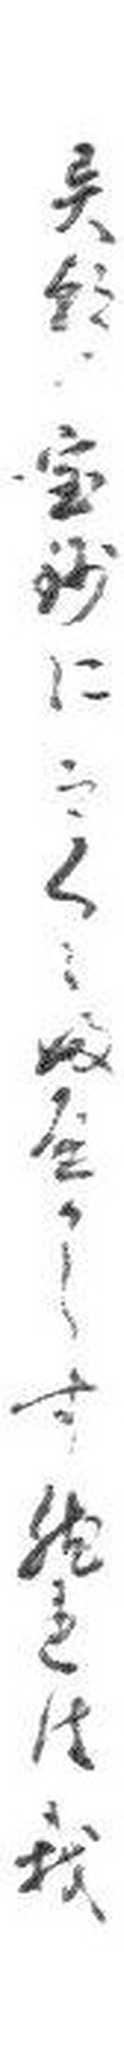異朝の宝鈔にはくらふへからす然れは我
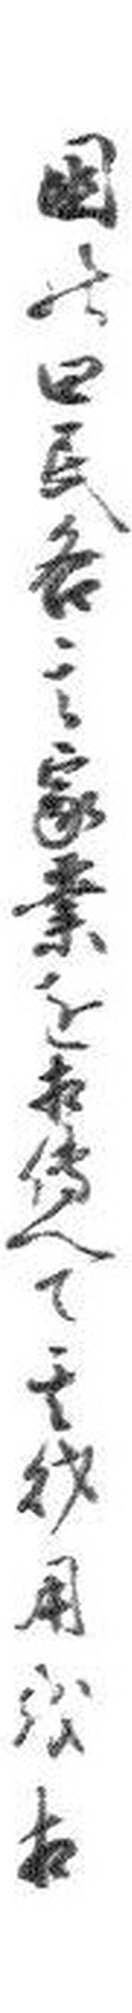国の四民各其家業を相伝へて其財用を相

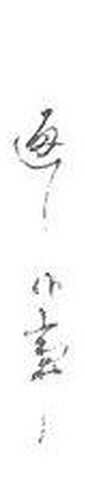通し候事
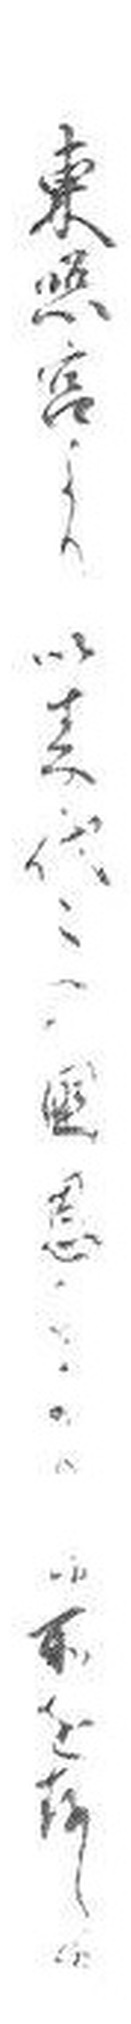東照宮より以来代々の国恩ニより候所を存し候
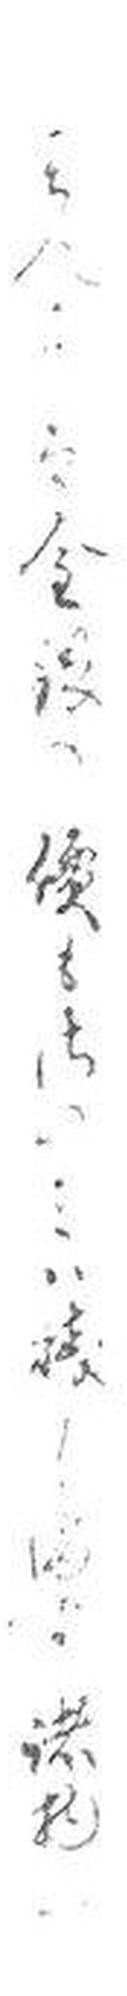はんには金銀の価もさのミハ賎します諸物の
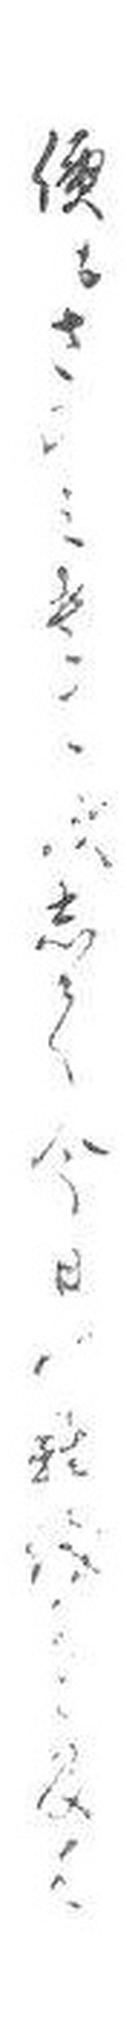価もさのミ貴はすして今日の難儀ニも及は
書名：家譜 二十九 吉邦公 従正徳二年到正徳三年
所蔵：福井県文書館 Fukui Prefectural Archives
